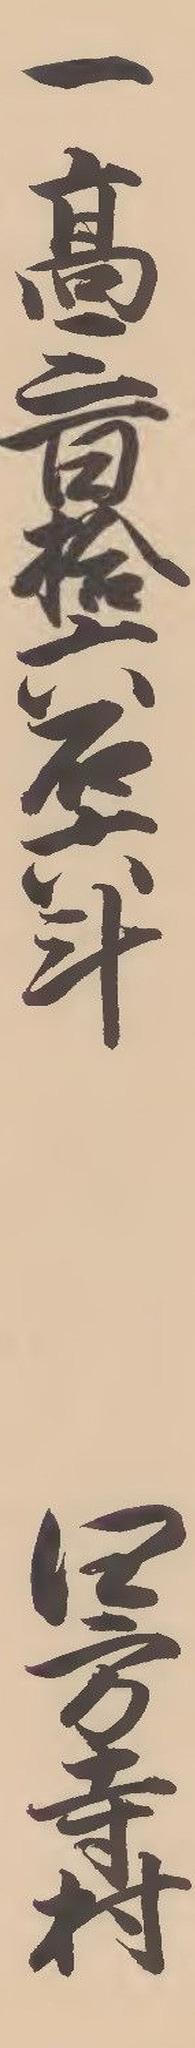一高三百拾六石六斗四方寺村

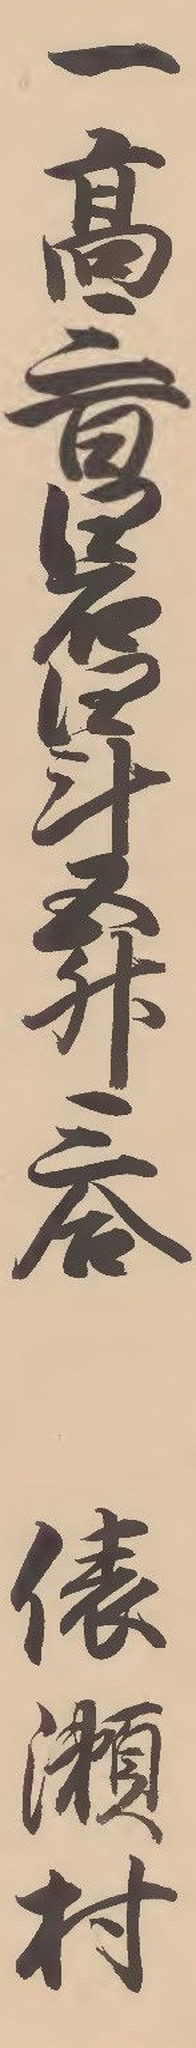一高三百四石四斗五升三合俵瀬村
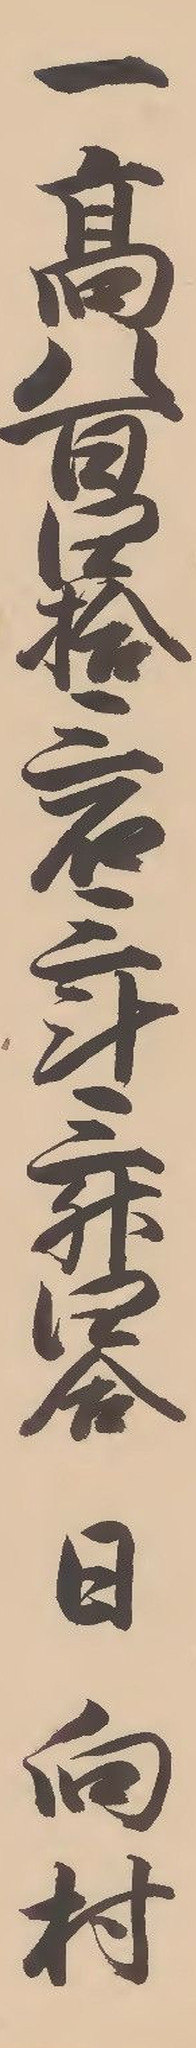一高八百四拾三石三斗三四合日向村
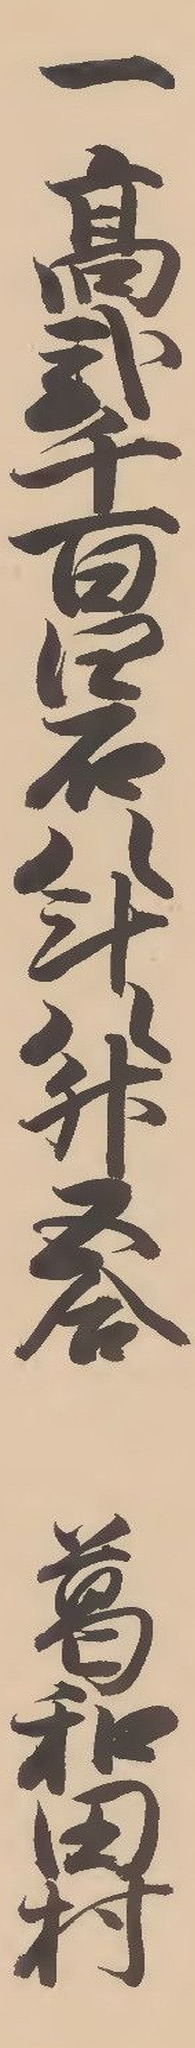一高弐千百四石八斗八升五合葛和田村
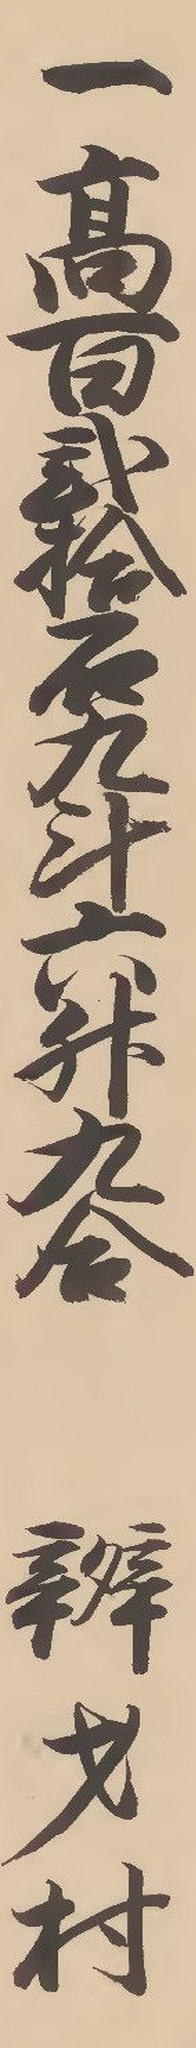一高百弐拾石九斗六升九合弁才村
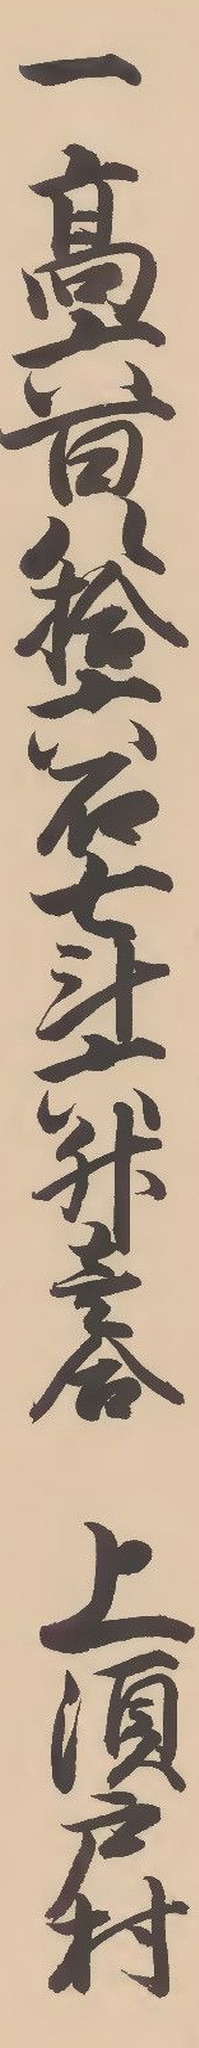一高六百八拾六石七斗六升壱合上須戸村
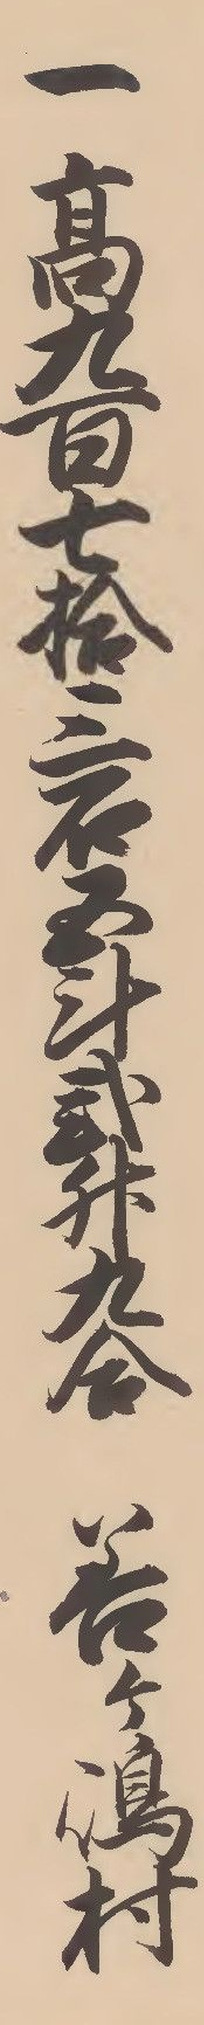一高九百七拾三石五斗弐升九合善ヶ嶋村
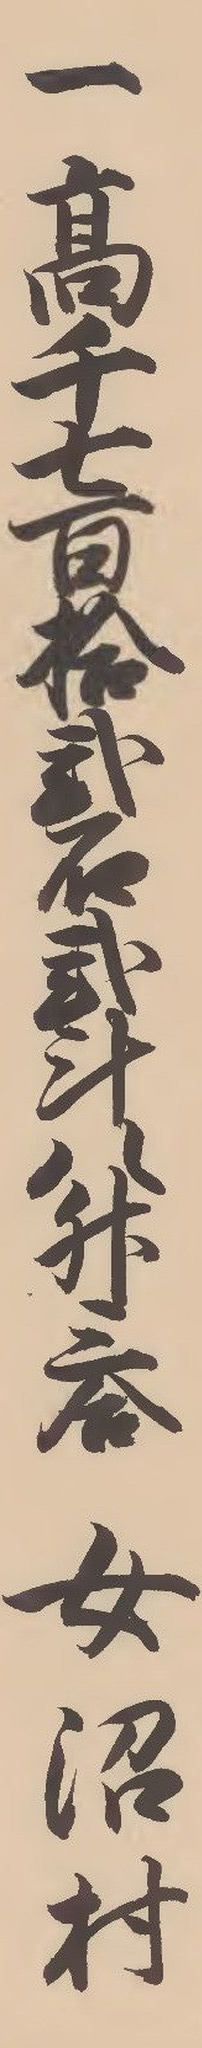一高千七百拾弐石弐斗八升三合女沼村
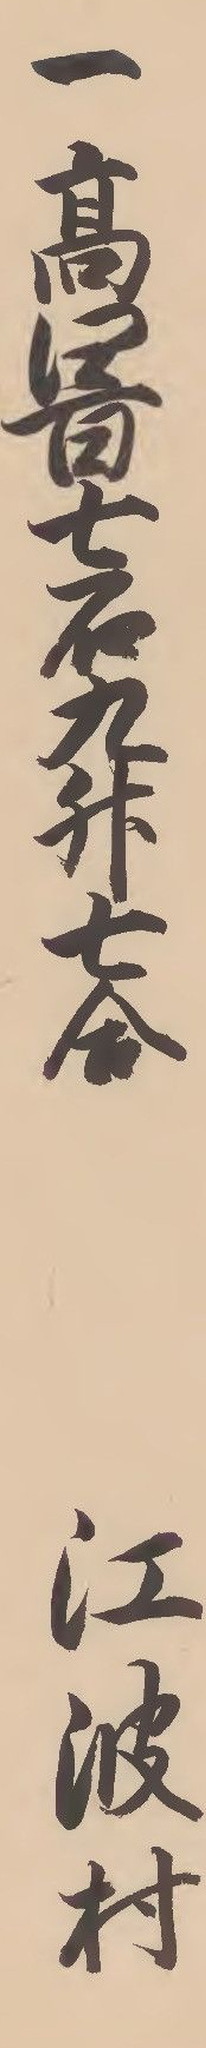一高四百七石九升七合江波村

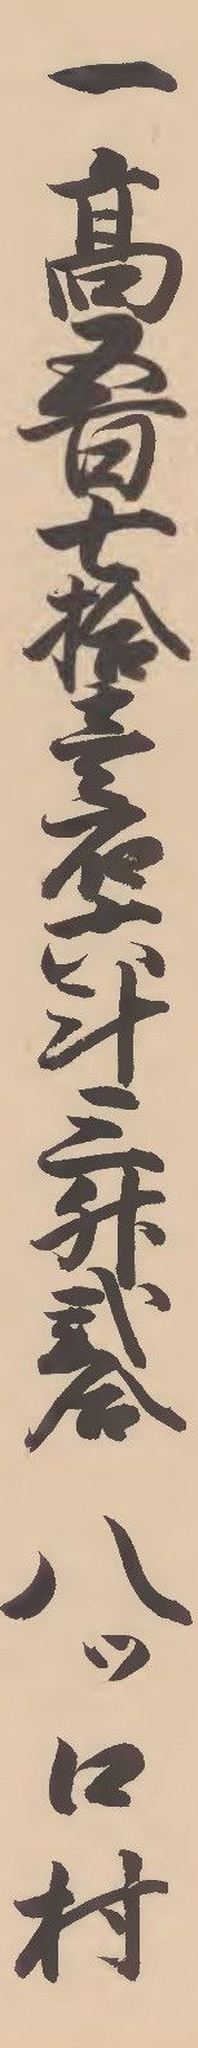一高五百七拾壱石六斗三升弐合八ツ口村
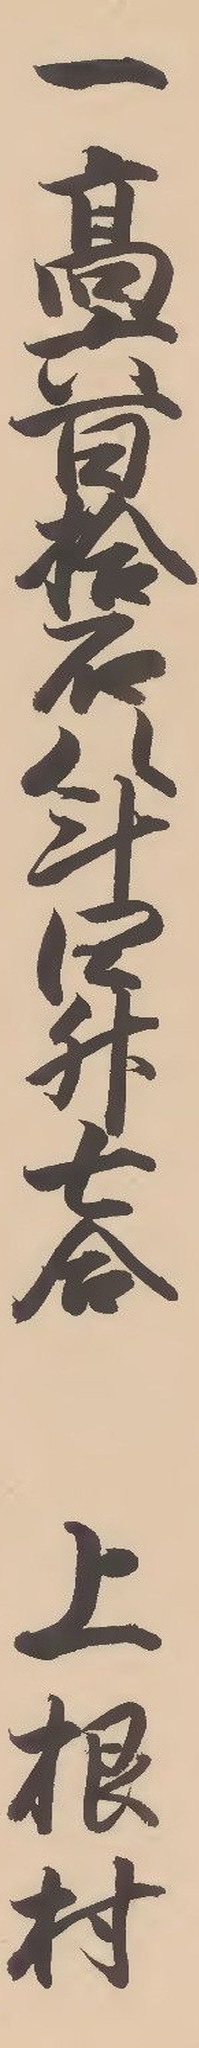一高六百拾石八斗四升七合上根村
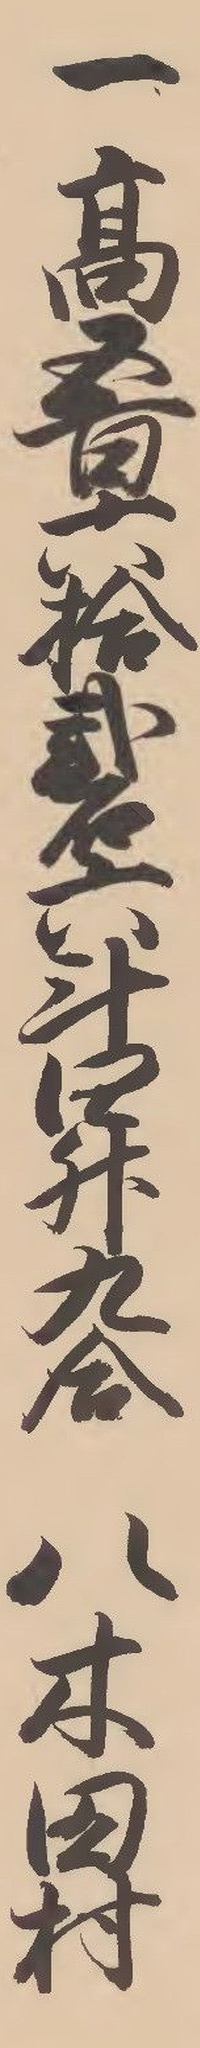一高五百六拾弐石六斗四升九合八木田村
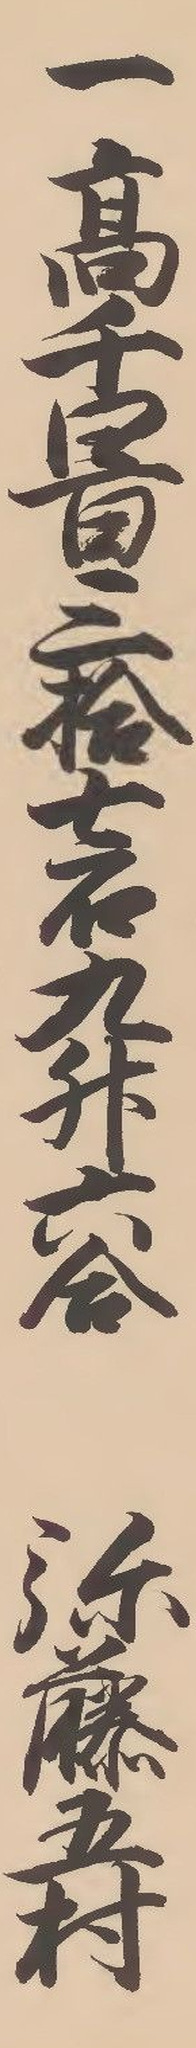一高千四百三拾七石九升六合弥藤五村
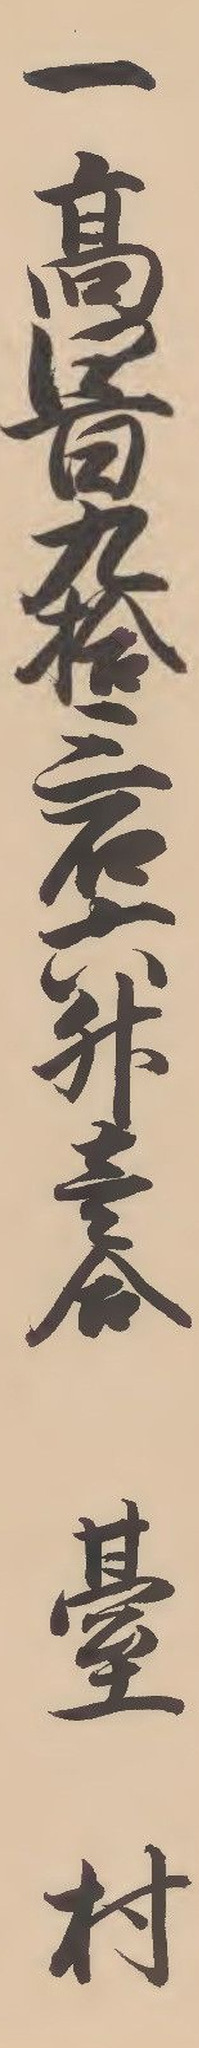一高四百九拾三石六升壱合台村
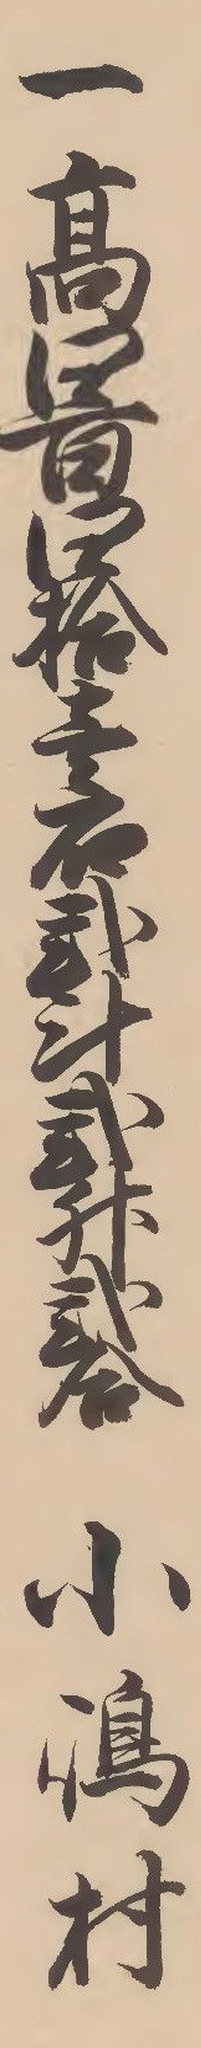一高四百四拾壱石弐斗弐升弐合小嶋村
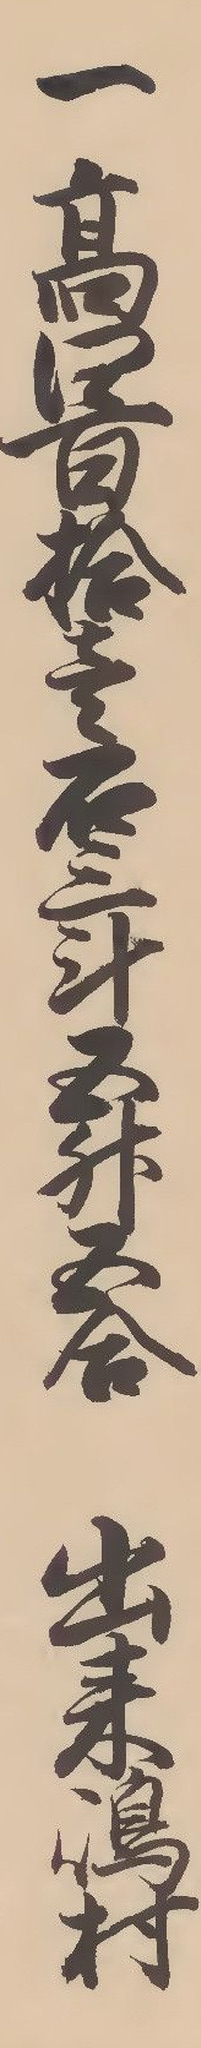一高四百拾壱石三斗五升五合出来嶋村
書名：武蔵国郷帳　下
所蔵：国立公文書館 National Archives of Japan
